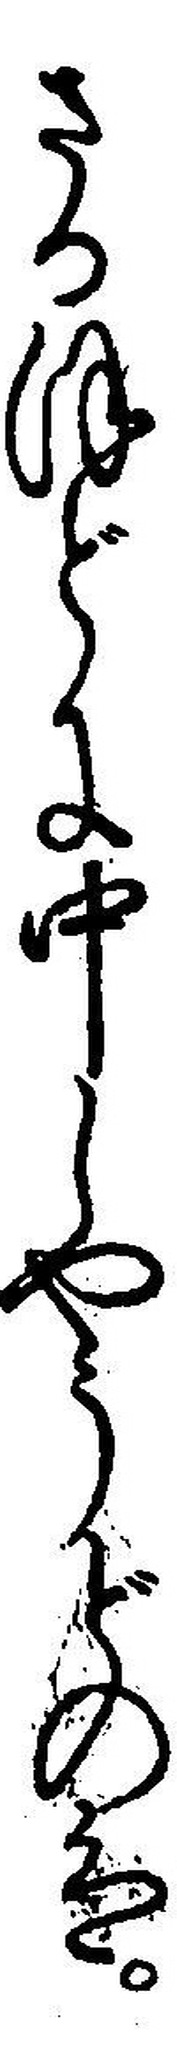さるほどに中しやうどのは。
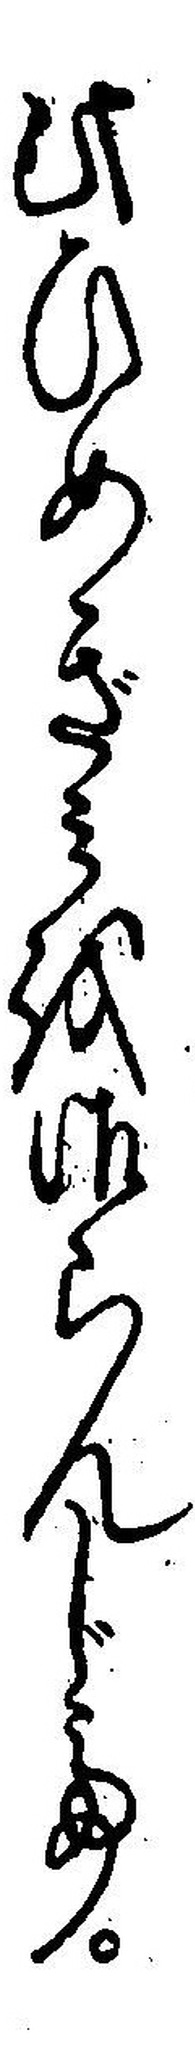此ひめぎみを御らんじて。
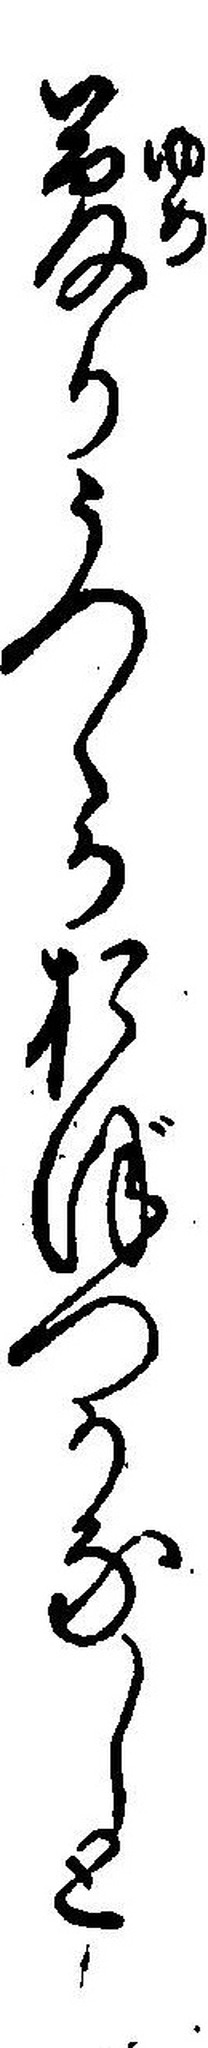夢かうつゝかおぼつかなしと
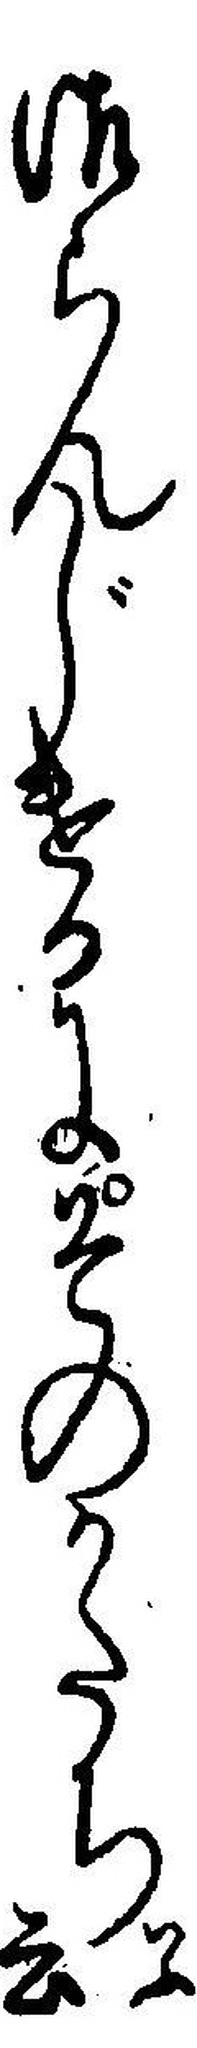御らんじけるに。そのかたち云
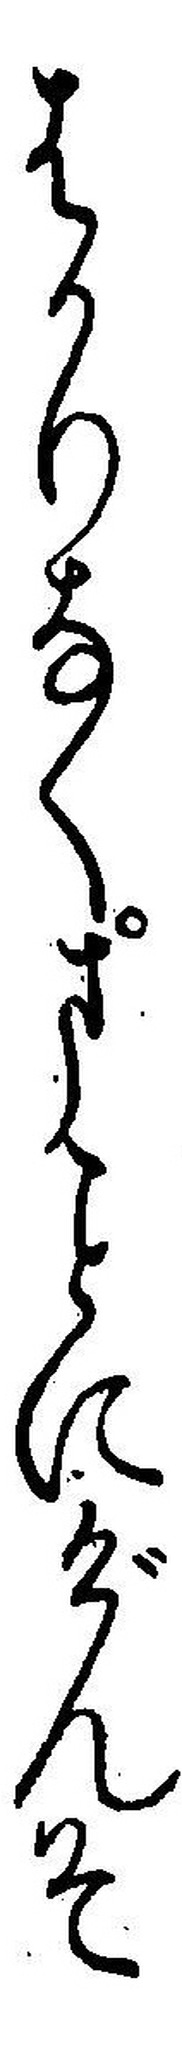はかりなく。まことにげんそ
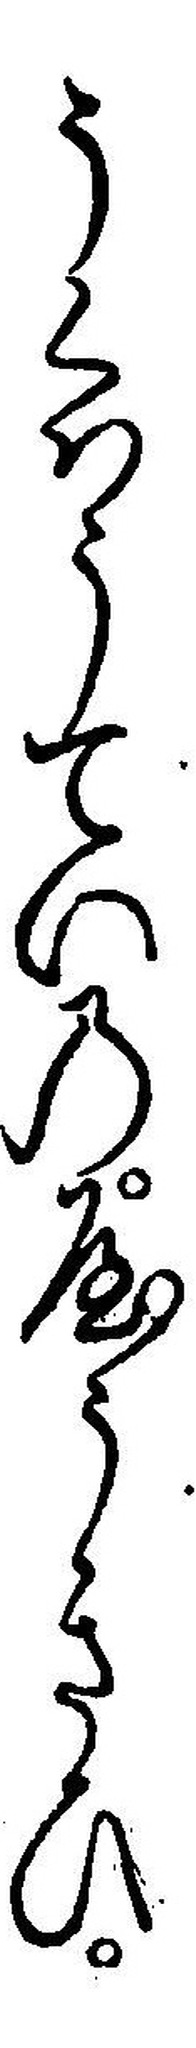うくはうていの。やうきひ。
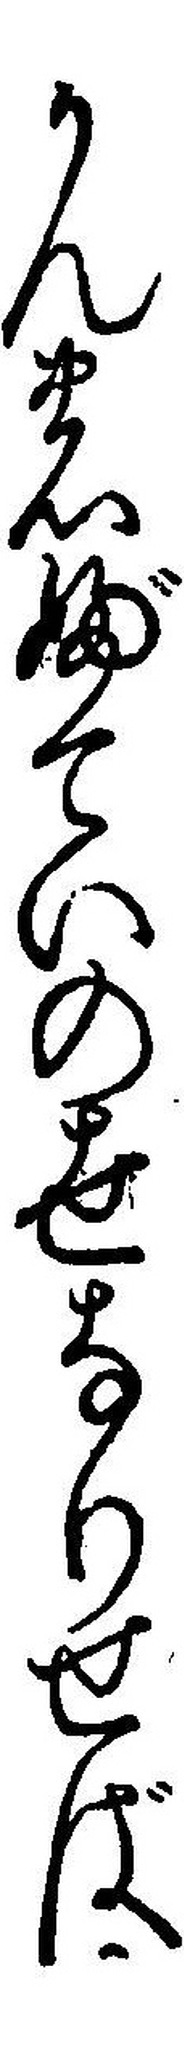かんのぶていの世なりせば。
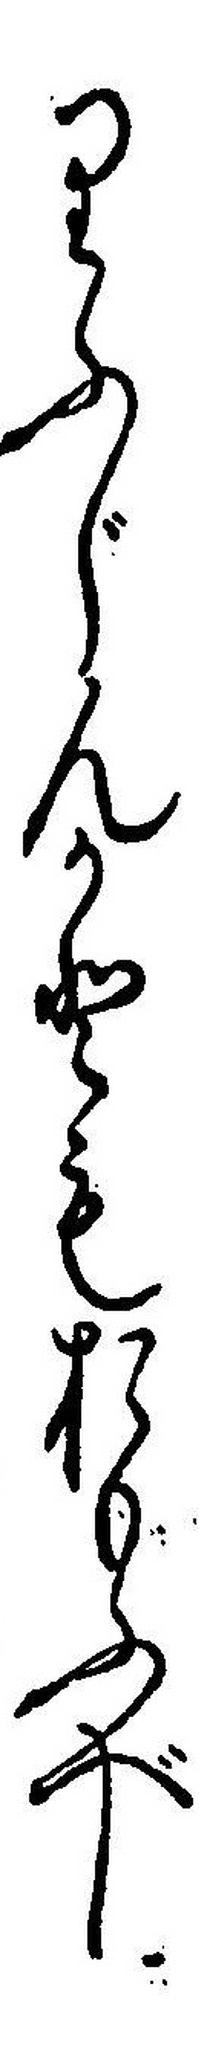りふじんかともおもふべし。
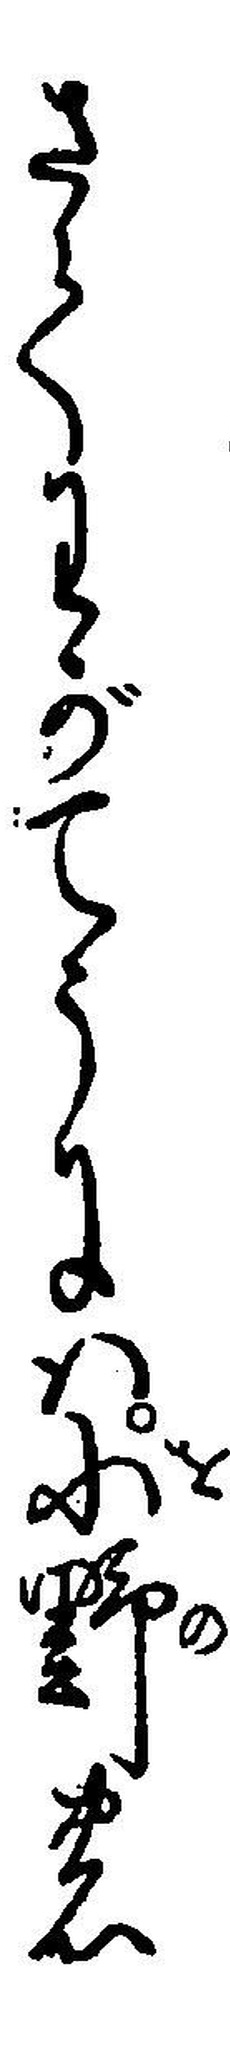さてわがてうには。小野の
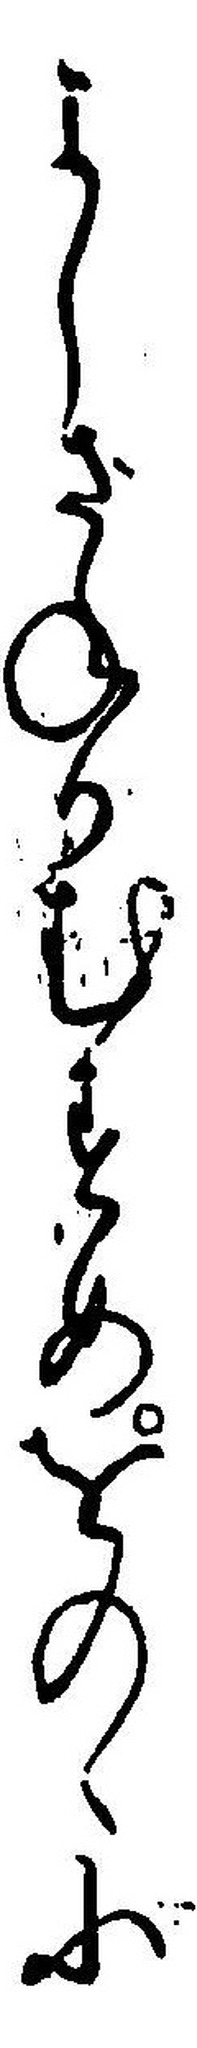よしざねがむすめ。をのゝ小
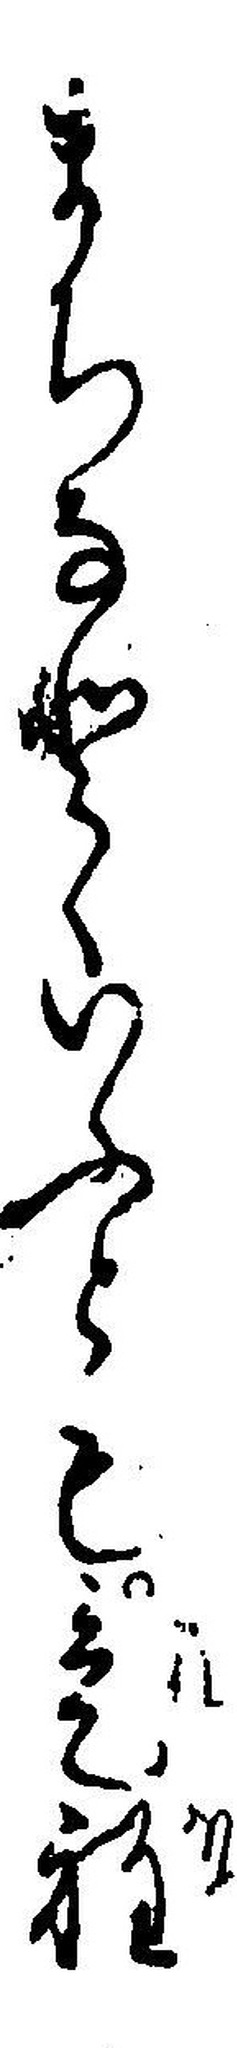まちなとゝいふとも。是程
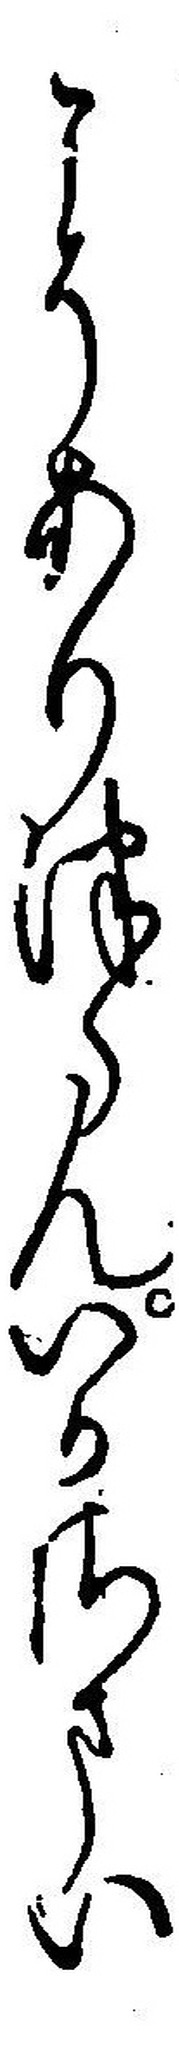にありつらん。いかさまい
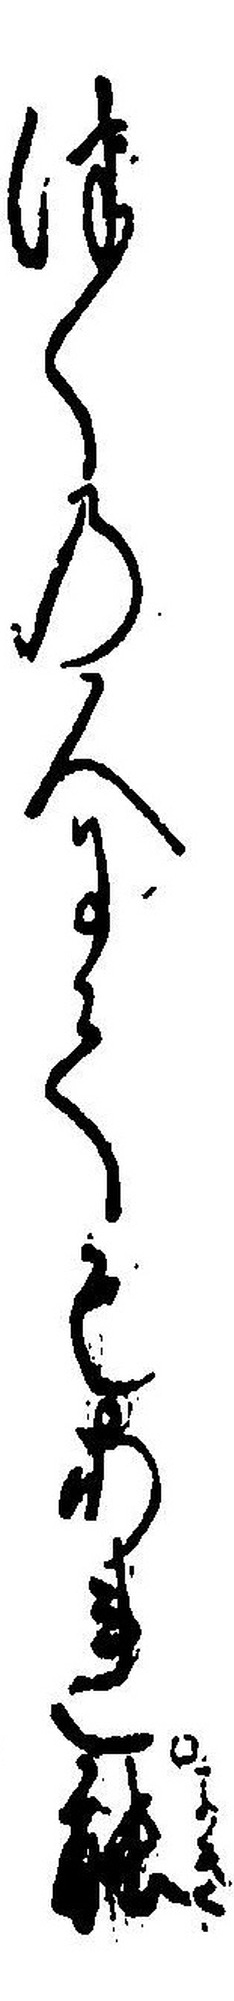つくの人にてもあれ。能
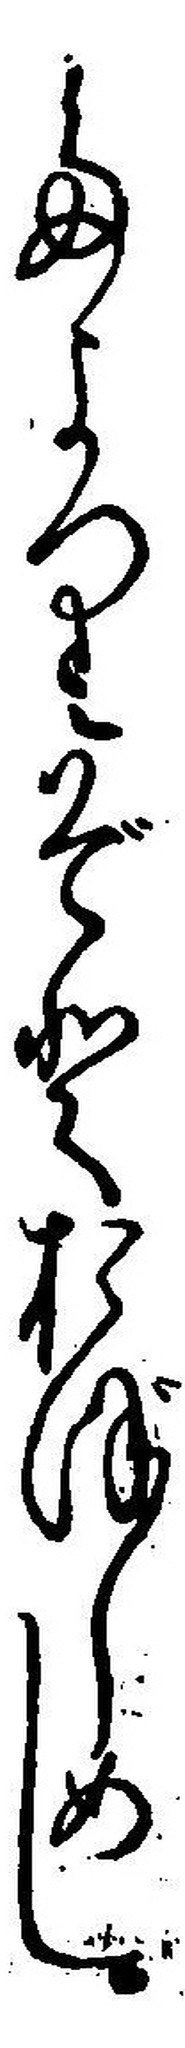たよりぞとおぼしめし。
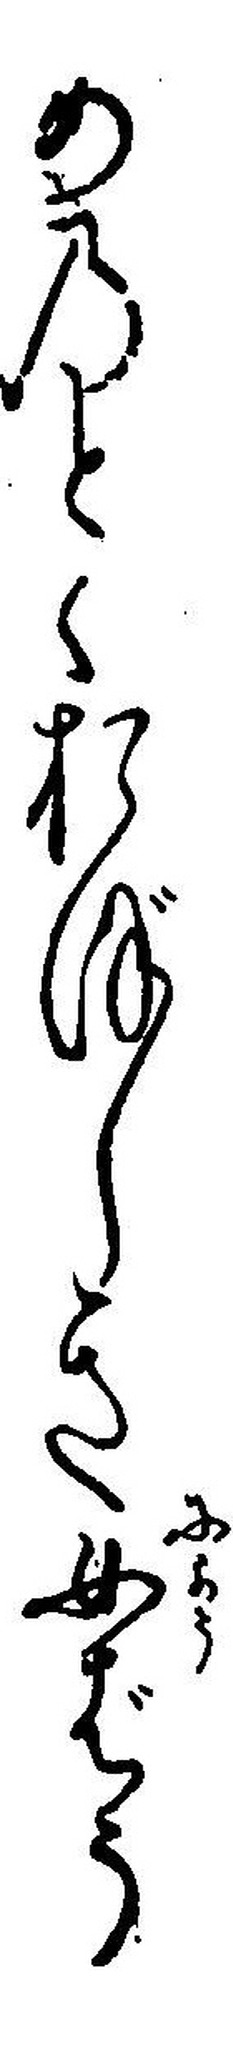めのとゝおぼしき女ばう
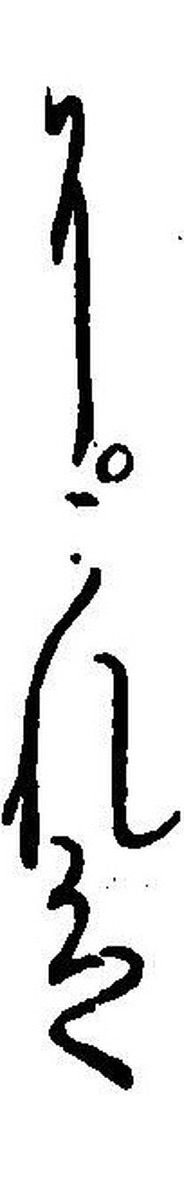に。かれは
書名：木幡きつね
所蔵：東京大学総合図書館 General Library in the University of Tokyo, JAPAN
